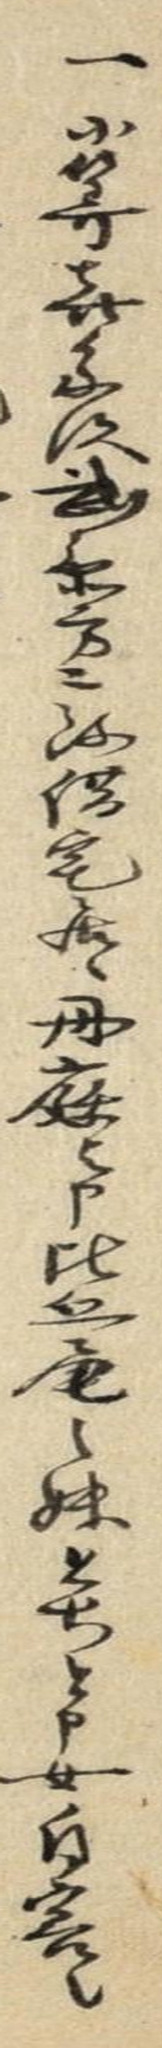一小算喜多沢武兵衛方に致借宅居候丹𢊆と申比丘尼之妹とちと申女自害之
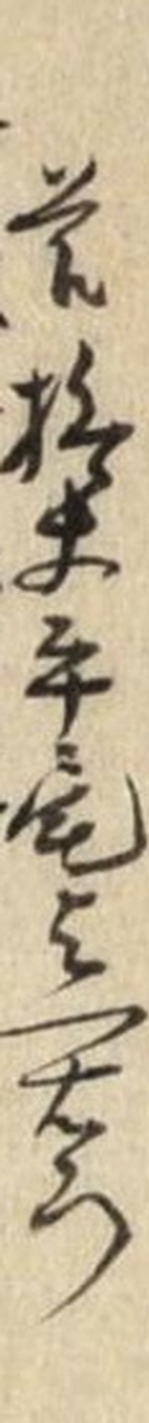節検使平尾与一右衛門
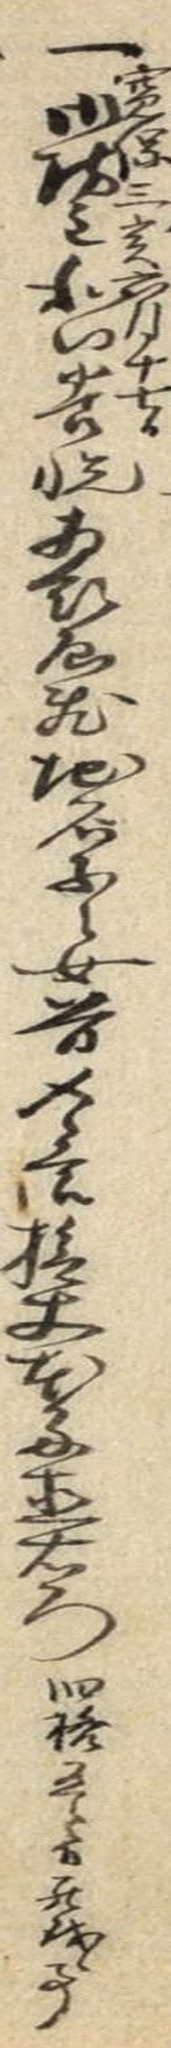一御坊主和田善悦拝領屋敷地名子之女首〆候節検使本多直右衛門旧格有之に付罷越候事
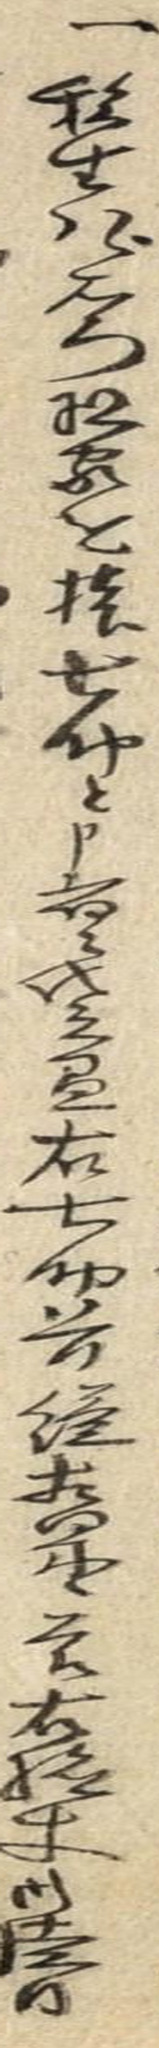一稲生八郎右衛門組家を挊七助と申者に貸置右七助首縊相果候節右検使御徒目
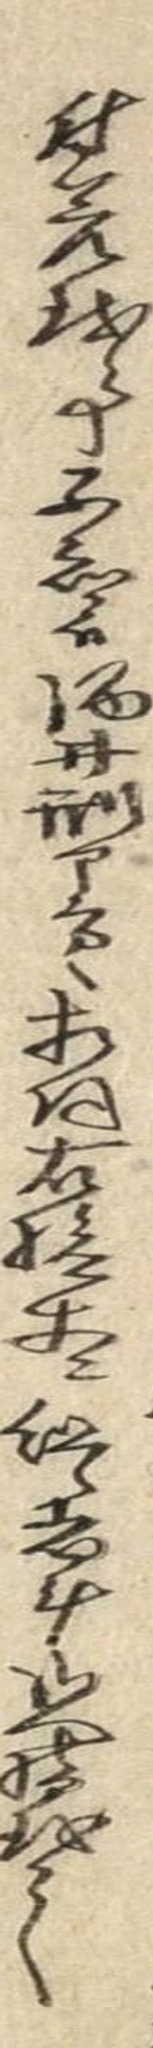付差越候事不知に付酒井刑部方へ相伺右検使に組之者斗弐人指越之
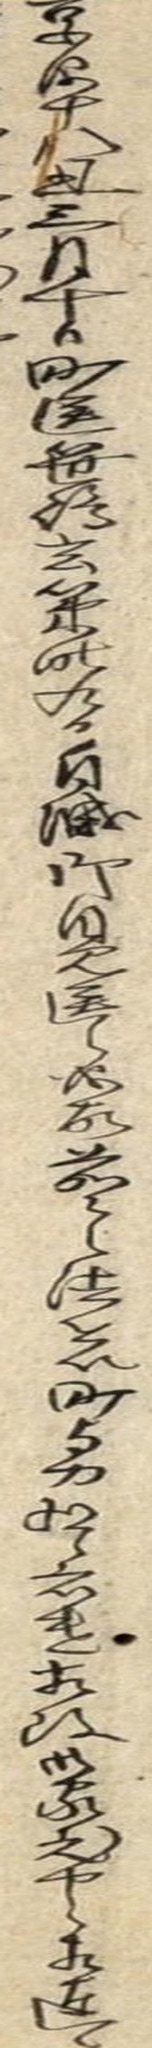一享保十八丑三月十日町医笹島玄策昨九日自滅御目見医之儀故前々之法を以町与力組之者遣相改御家老中へ相達候
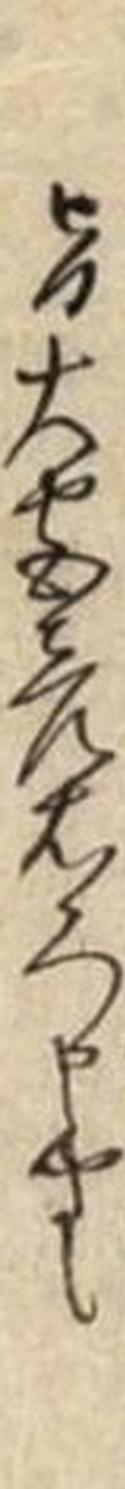旨大宮彦右衛門申聞候
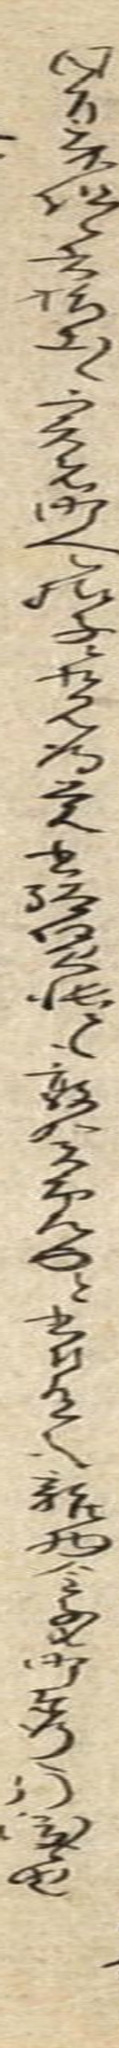目付并組之者指出候実は町人之様子に相見得覚書駄賃帳にも敦賀市左衛門と書付有之雑物金子共町奉行へ引渡候由
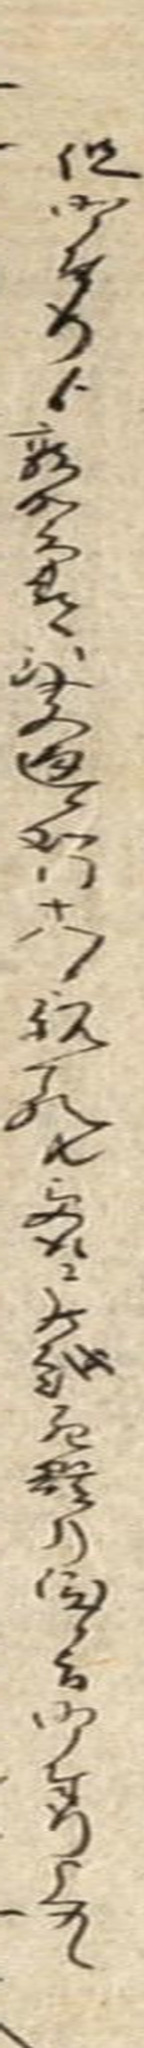但御奉行ゟ敦賀表へ致文通候処同十八日親類共受取に罷越死骸引渡候旨御奉行申聞候
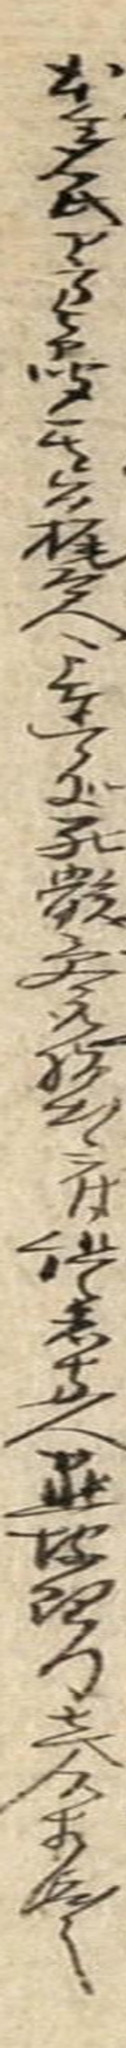本多民部方被申聞其旨梶大夫へ申達候処死骸受取指出候に付組之者両人韮塚理右衛門立合相渡之

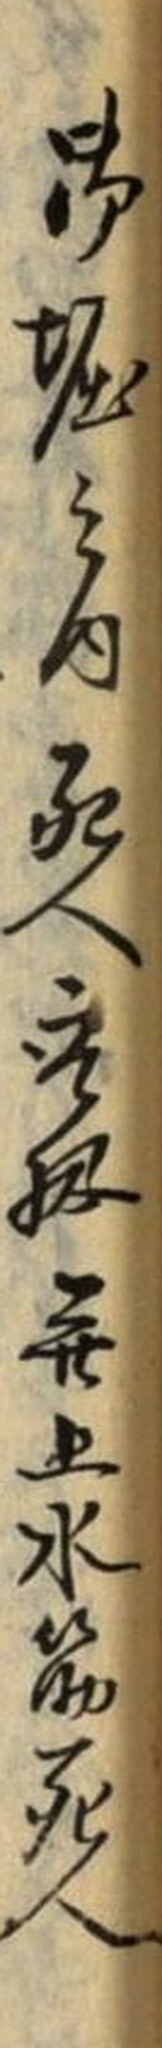御堀之内死人取扱并上水筋死人
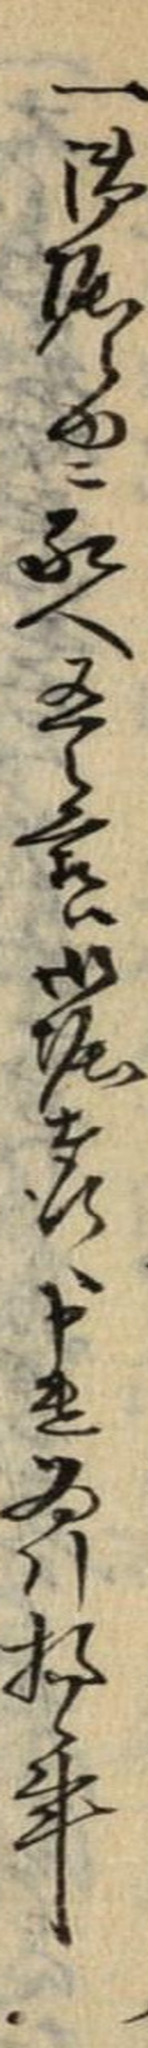一御堀之内に死人有之節は御堀奉行へ申遣為引揚候事
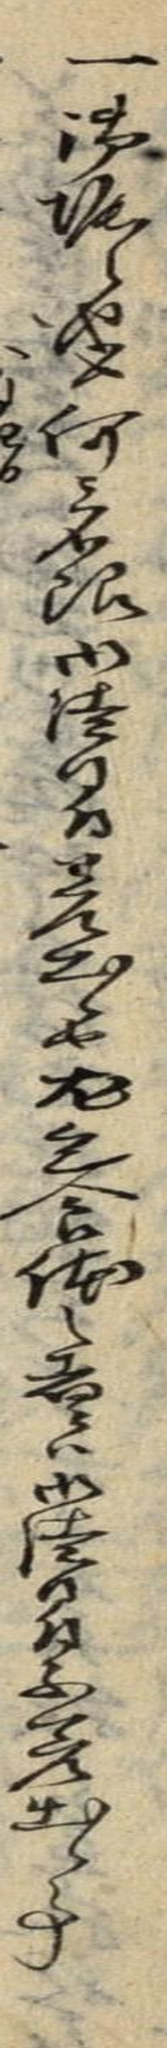一御堀之儀は何に不限御徒目付差出候由尤乞食体之者には御徒目付不差出候事
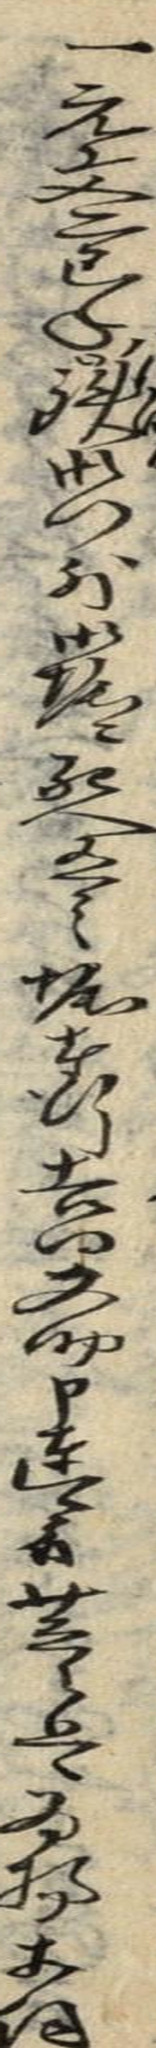一元文二巳年◦鉄八月四日御門外御堀に死人有之堀奉行吉田又助申達候に付芝之上へ為揚相伺
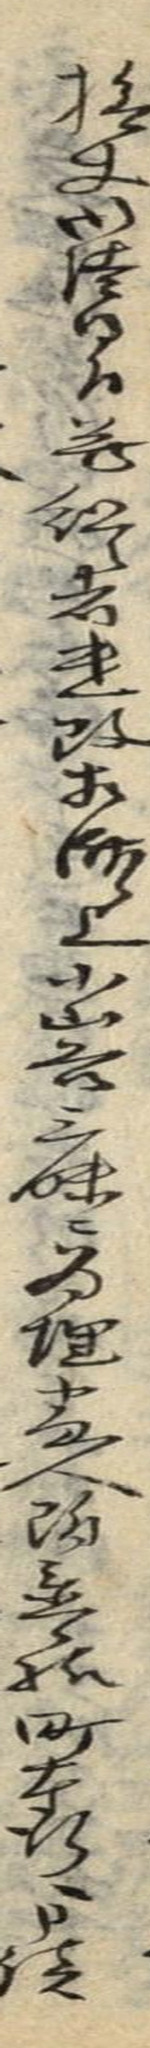検使御徒目付并組之者遣改相済候上小山谷三昧に為埋番人附置候様町奉行へ申談
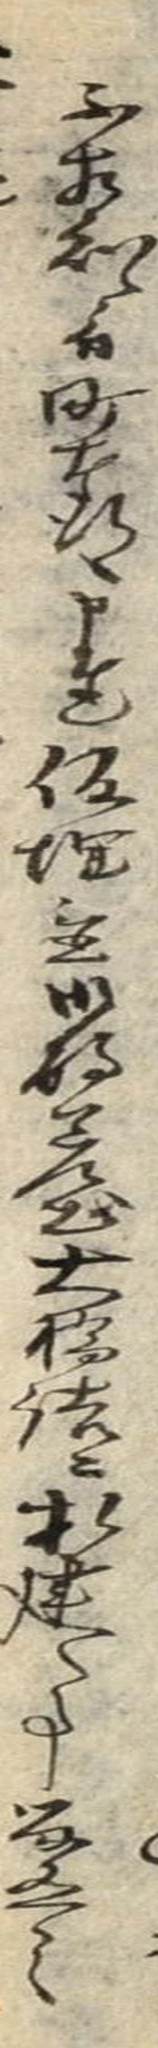不相知候に付町奉行へ申達仮埋置御触差出大橋詰に札建候事留有之
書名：御停止異変死失
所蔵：福井県文書館 Fukui Prefectural Archives
